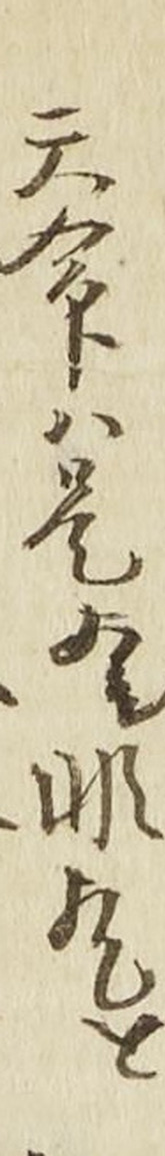天命は是歟非歟と
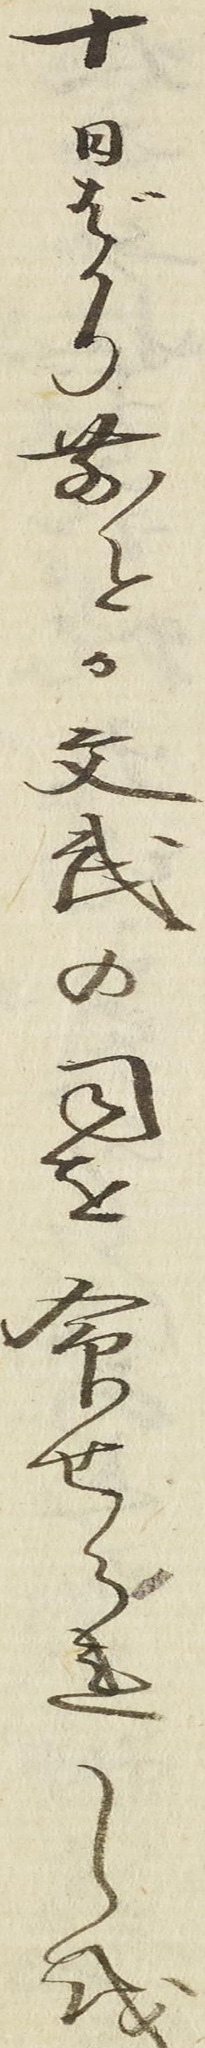十日ばかり前とか文武の司を命せられしを
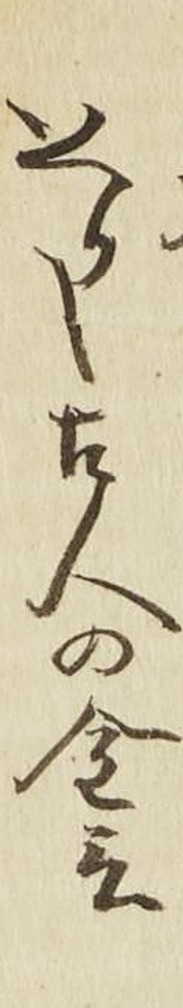いへりし古人の金言
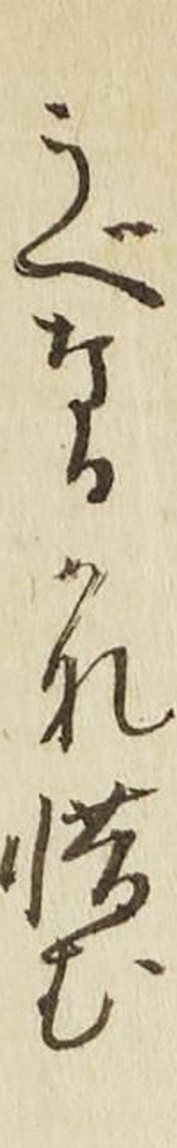うべなるかな惜む
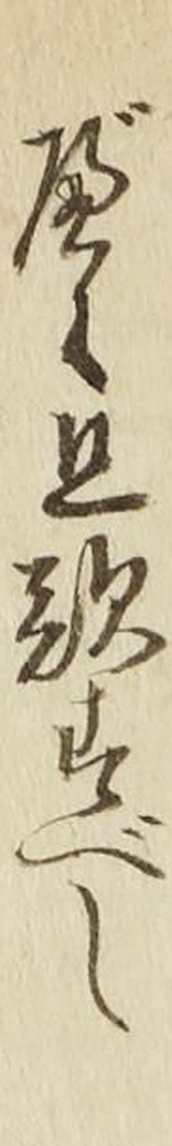べく且歎すべし
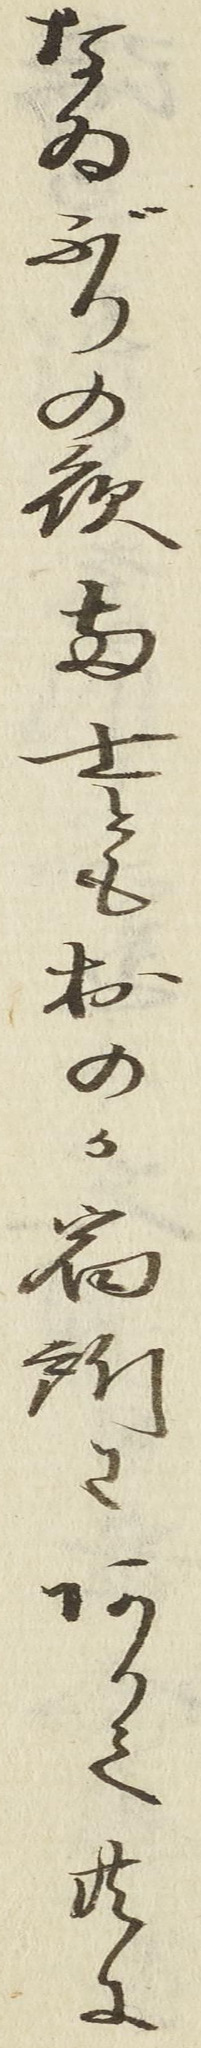なゐぶりの夜両士ともおのか宿所にありて共に
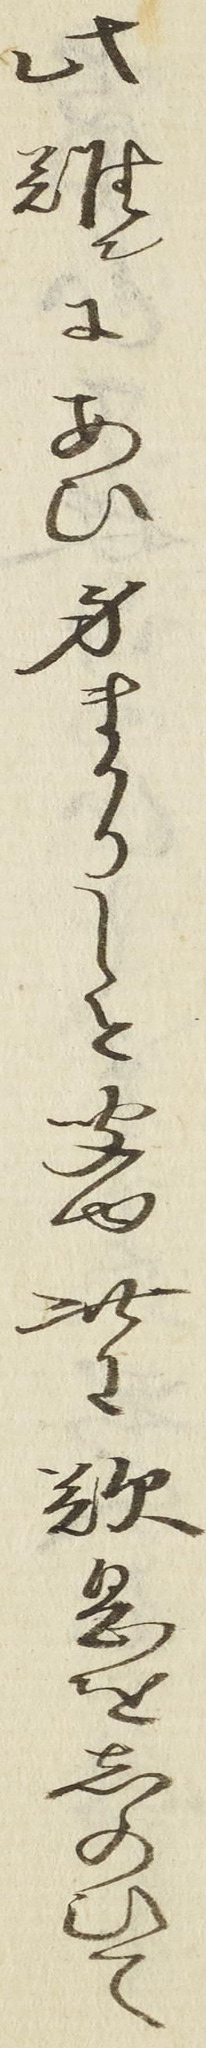此難身まかりしと聞ゆ此に歎息をしのひて
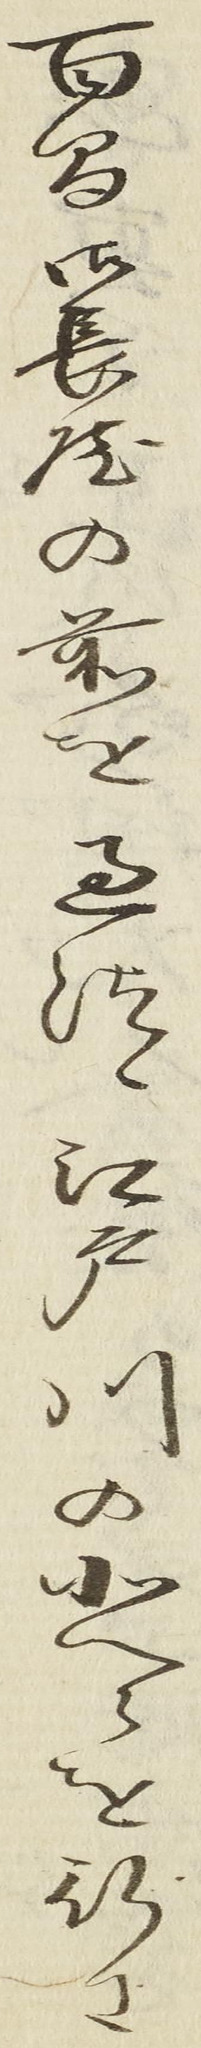百間御長屋の前を過つゝ江戸川の北へらを行に
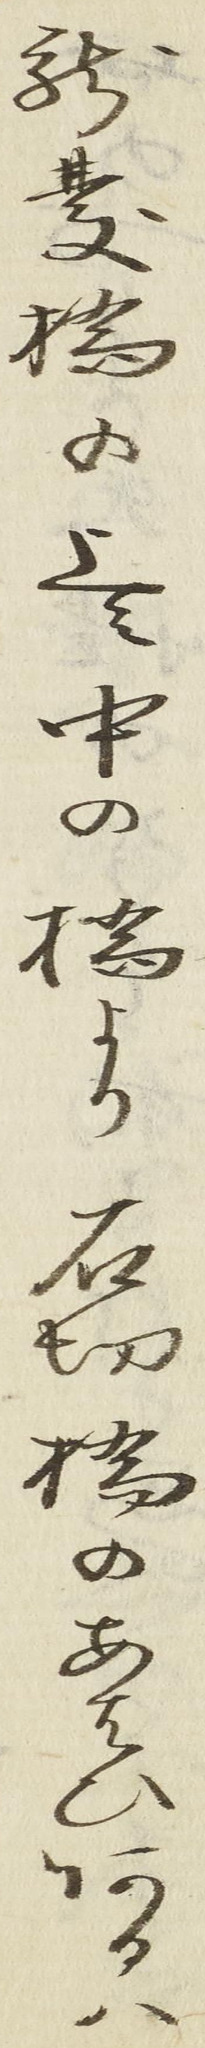龍慶橋の上之中の橋より石切橋のあはひあるは
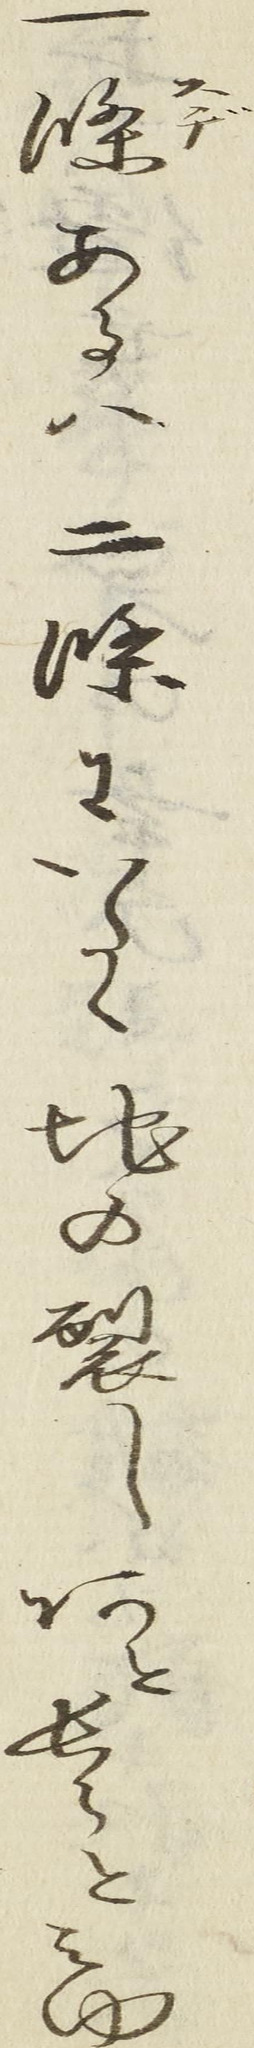一條あるは二條にいたく地の裂しあと長〻とみゆ
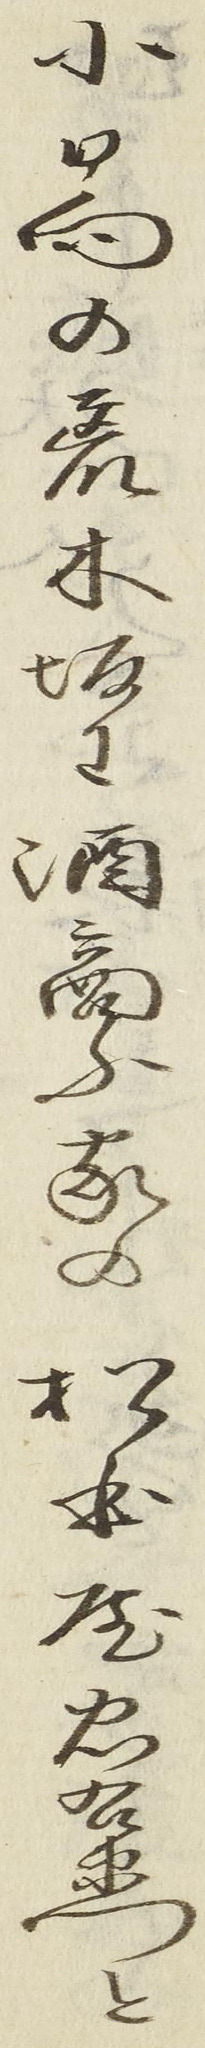小日向の荒木坂に酒商ふ家の松本屋忠右衛門と
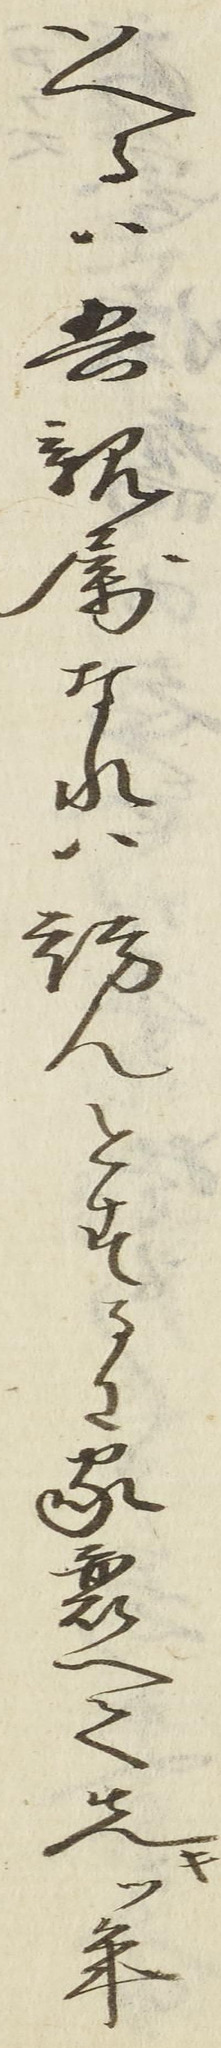いへるは吾親属なれは訪んとするに家衰へて先年
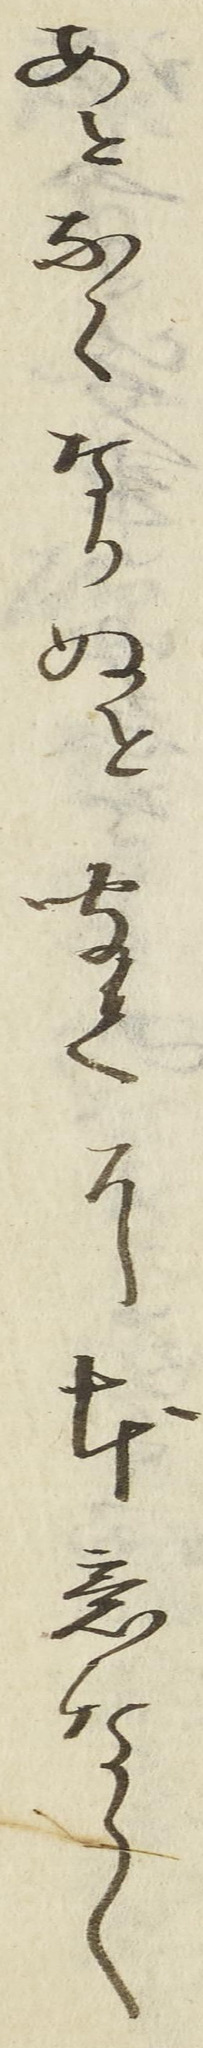あとなくなりぬと聞くに本意なく
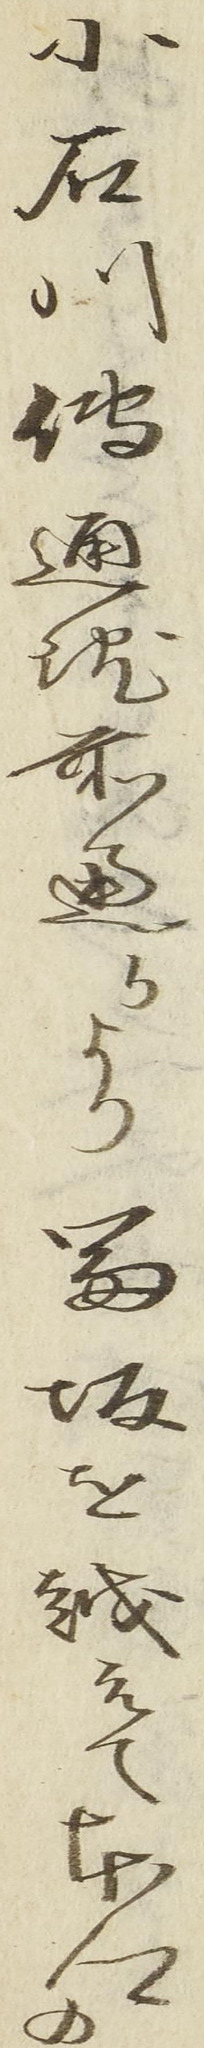小石川伝通院前通りより富坂を越えて本郷の

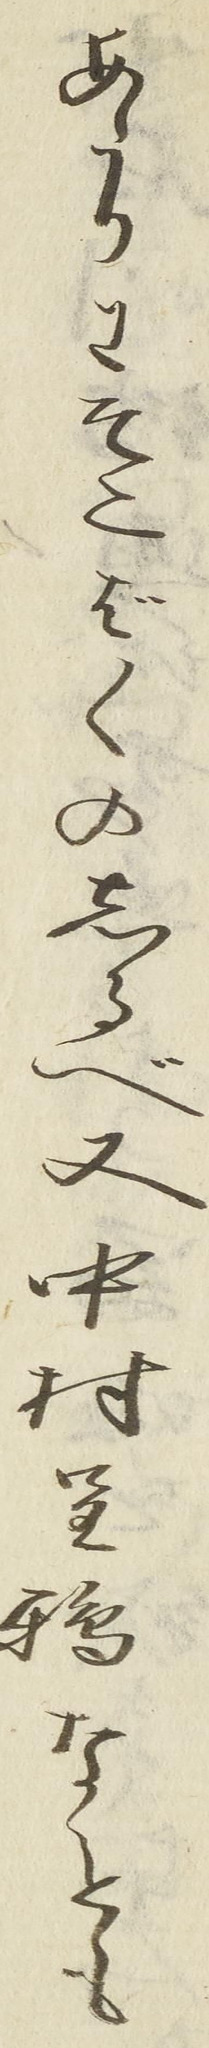あたりにそこばくのしるべ又中村呈鴉なとも
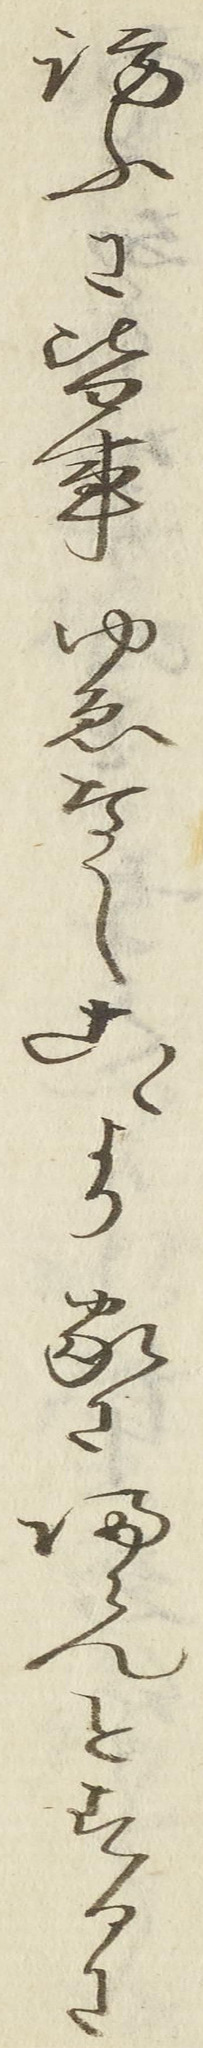訪ふに皆事ゆえなしこゝより家に帰んとするに
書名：やぶれ窓の記　全
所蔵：東京大学地震研究所図書室 Earthquake Research Institute Library, The University of Tokyo, JAPAN
